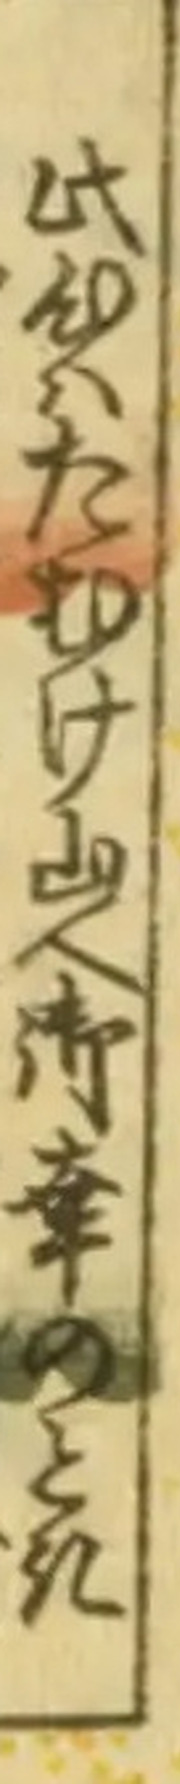此心はたむけ山へ御幸のとき
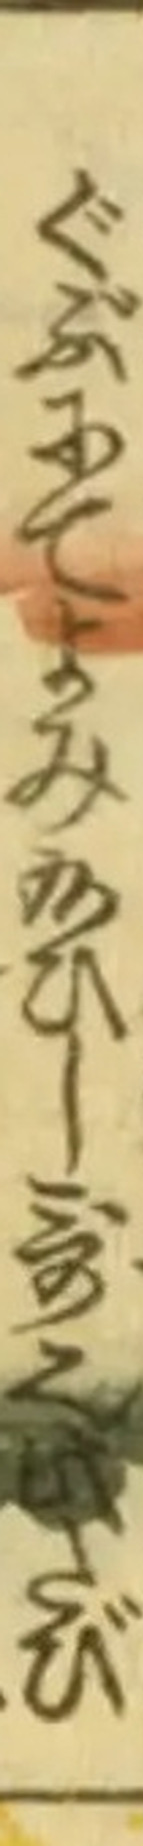ぐぶにてよみ給ひし歌也此たび
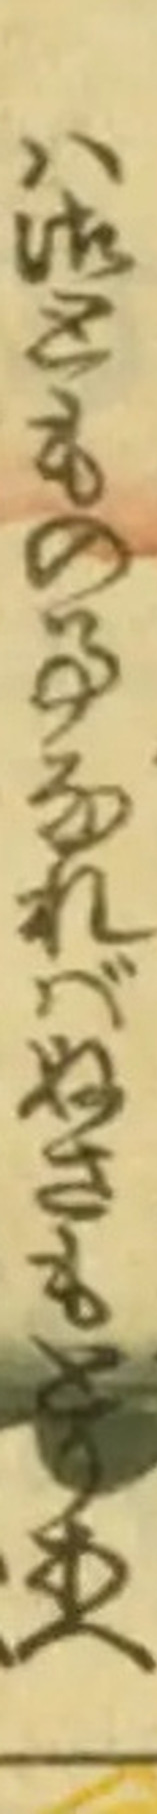は御ともの事なればぬさもとりあへ
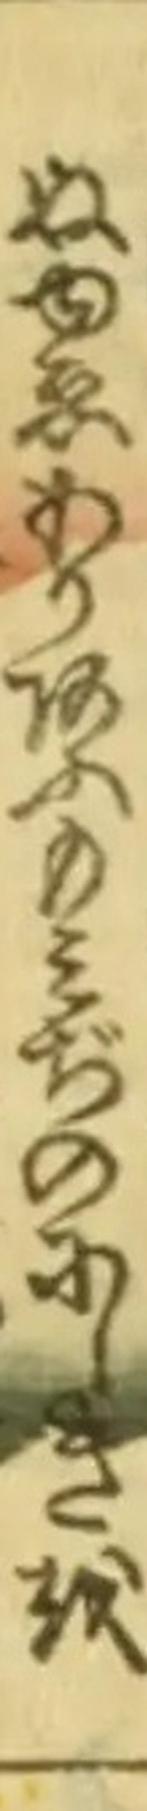ぬゆゑありあふもみぢのにしきを
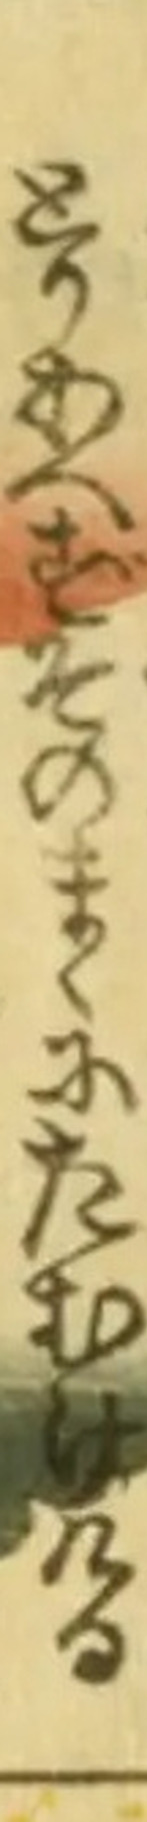とりあへずそのまゝにたむけける
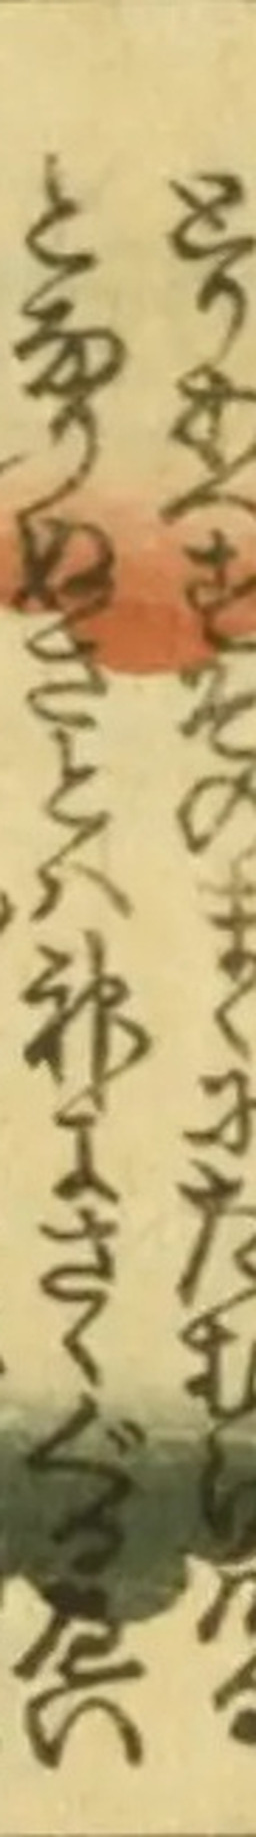となりぬさとは神にさゝぐるへい
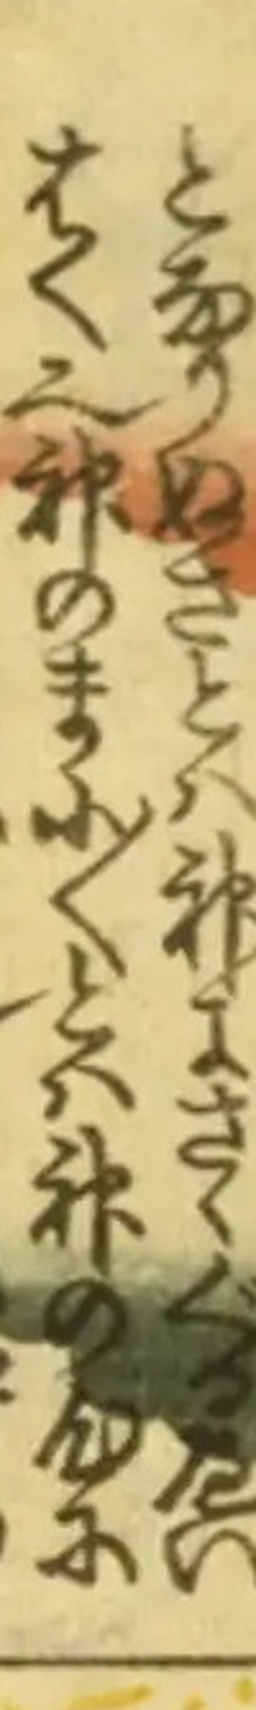はく也神のまに〳〵とは神の心に
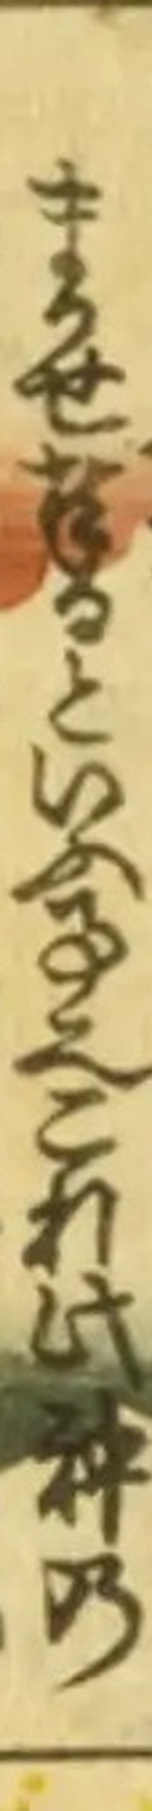まかせ奉るといふ事也これ此神の
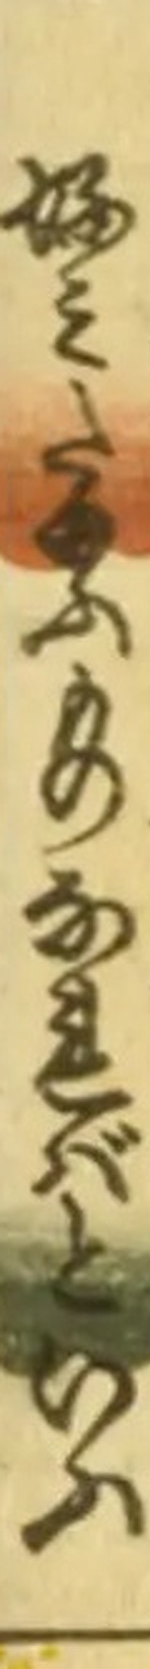好みたまふものなればといふ
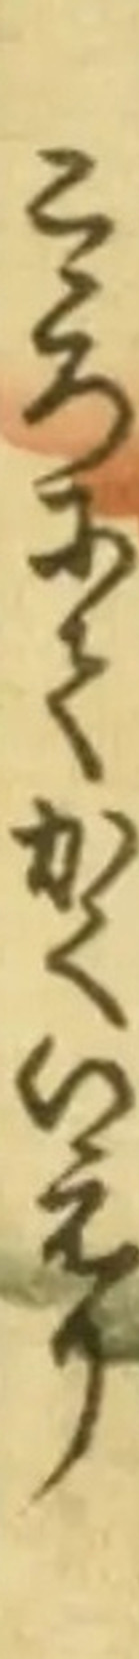こゝろにてかくいえり
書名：百人一首絵抄　廿四　菅家
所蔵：国立国会図書館 National Diet Library, JAPAN
